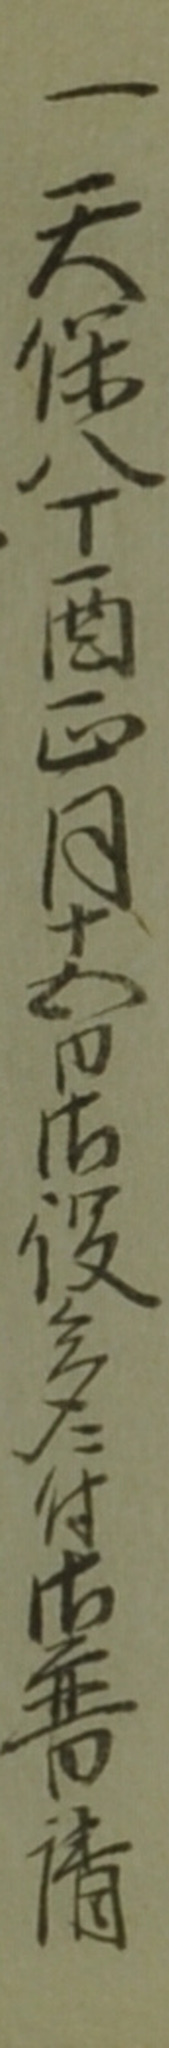一天保八丁酉正月十五日御役多ニ付御普請
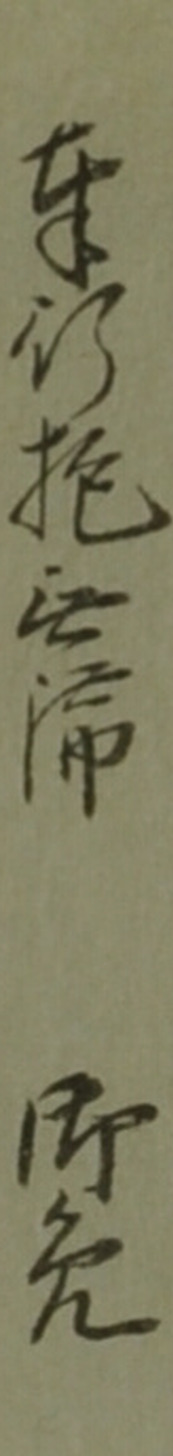奉行抱無滞御免
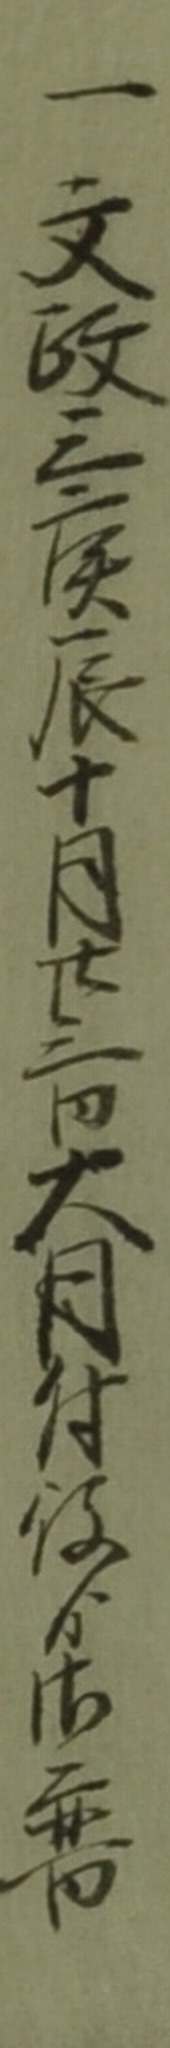一文政三庚辰十月廿三日大目付役ゟ御普
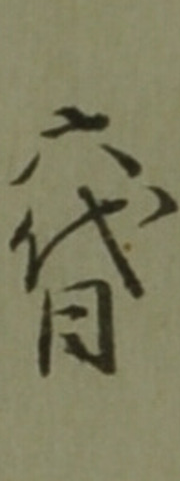六代目
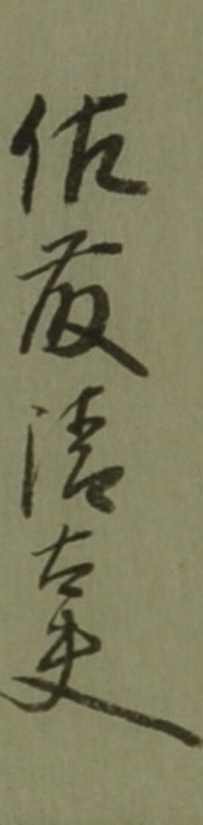佐藤清太夫
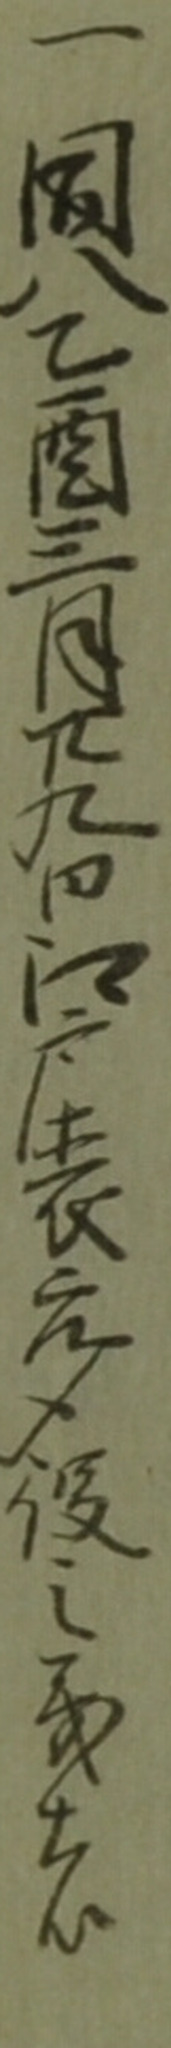一同八乙酉三月廿九日江戸表元〆役之義者
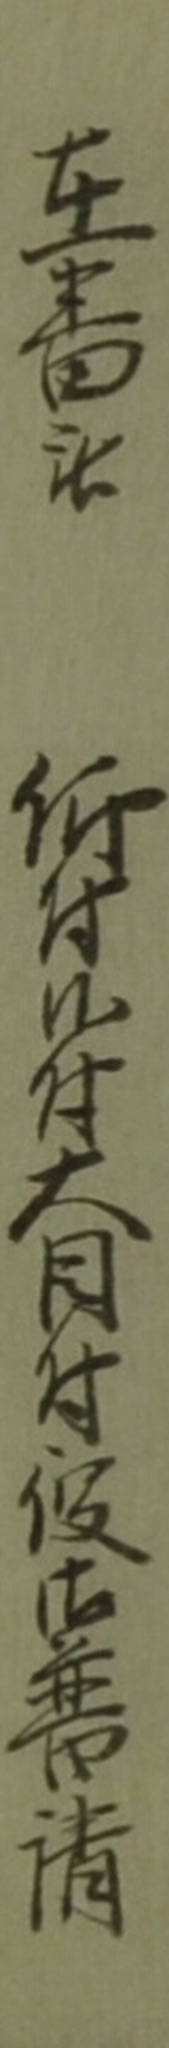在番被仰付候付大目付役御普請
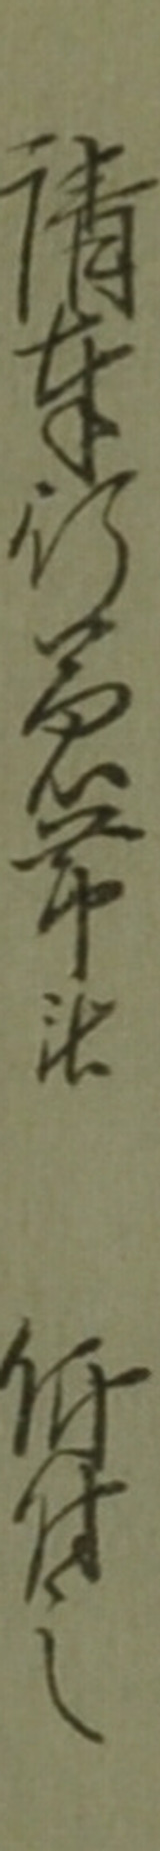請奉行兼帯被仰付之
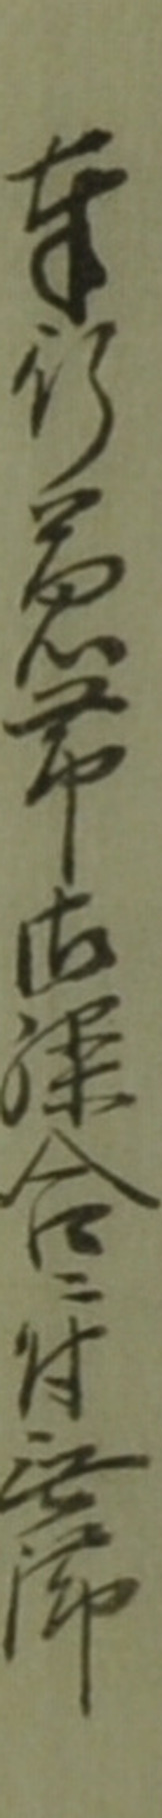奉行兼帯御繰合ニ付無滞
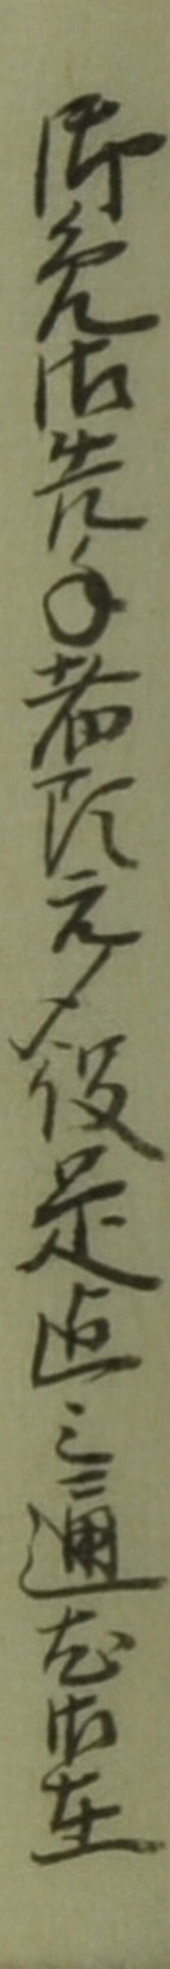御免御先手者頭元〆役是迄之通尤御在

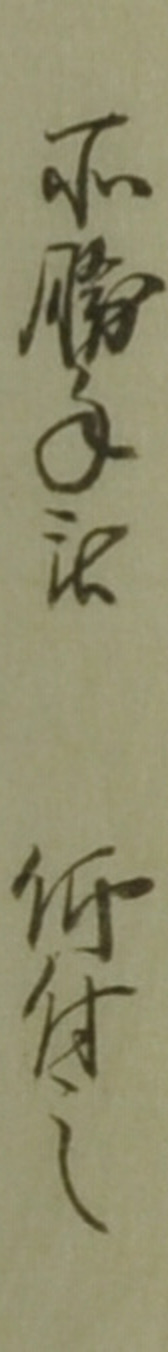所勝手被仰付之
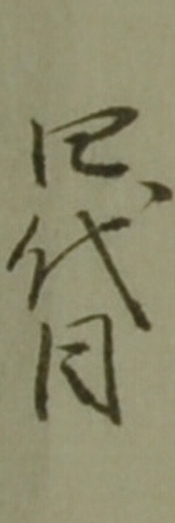四代目
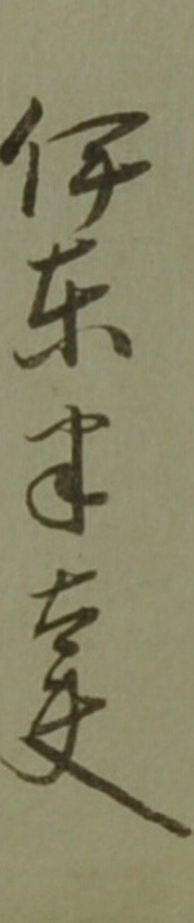伊東半太夫
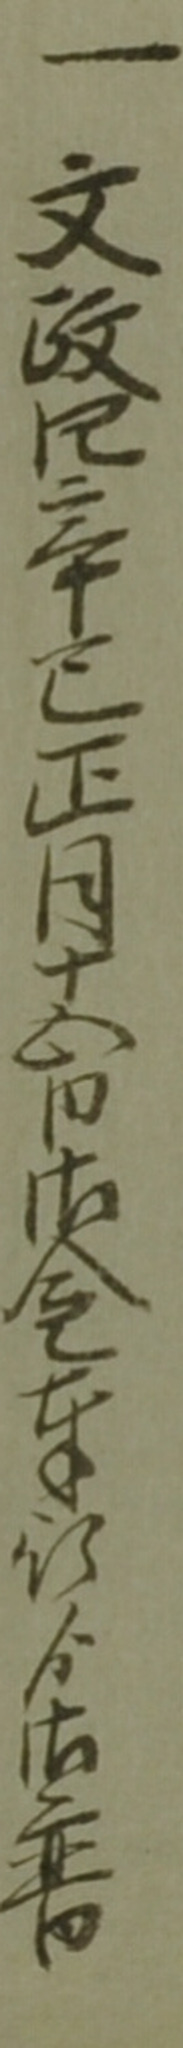一文政四辛巳正月十五日御金奉行ゟ御普
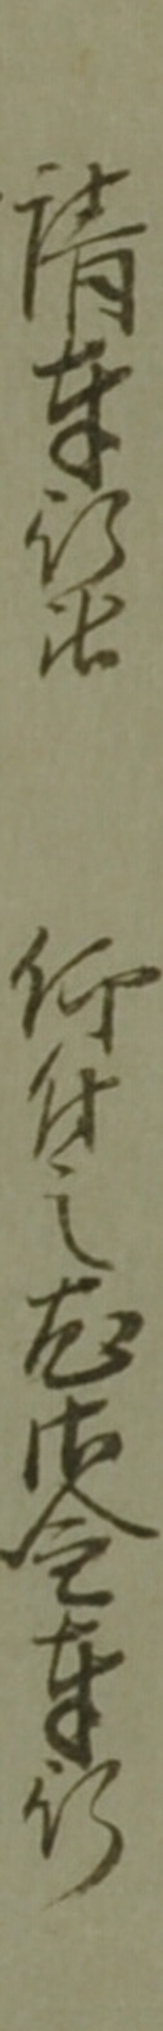請奉行被仰付之尤御金奉行
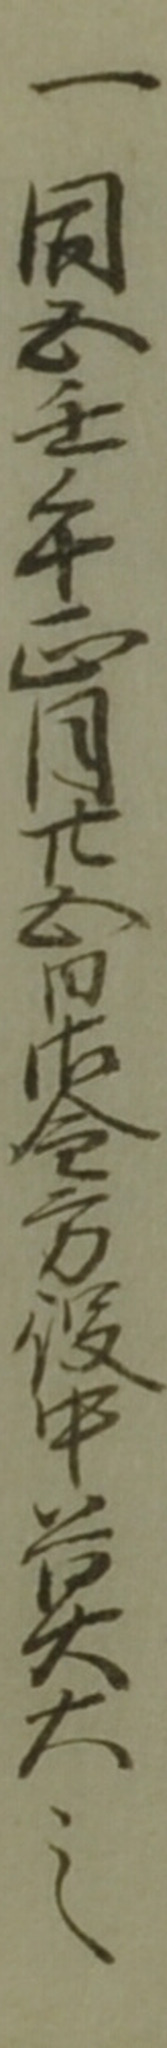一同五壬午正月廿五日御金方役中莫大之
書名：諸御役代々録（六）
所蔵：伊那市立高遠町図書館・合同会社AMANE
